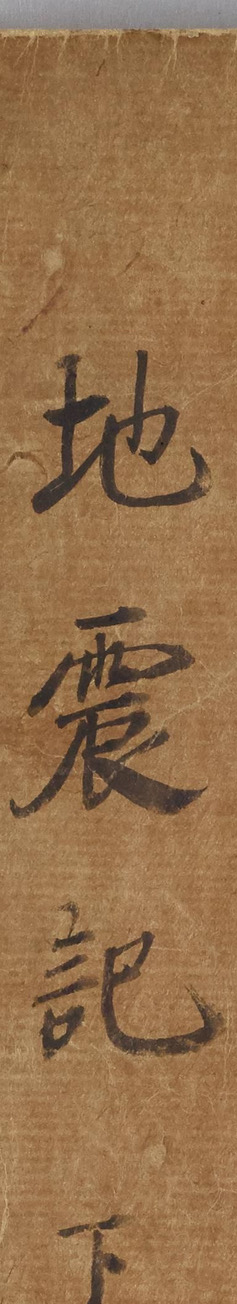地震記下

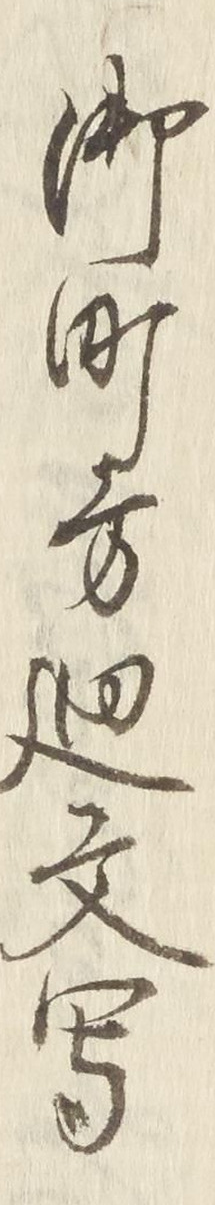◯御町方廻文写
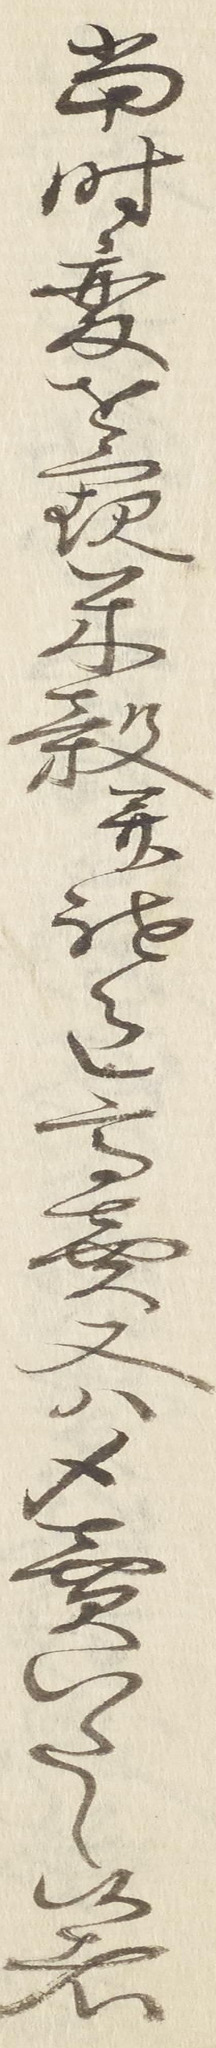当時変を窺米穀并諸色高売又は〆売いたし候者
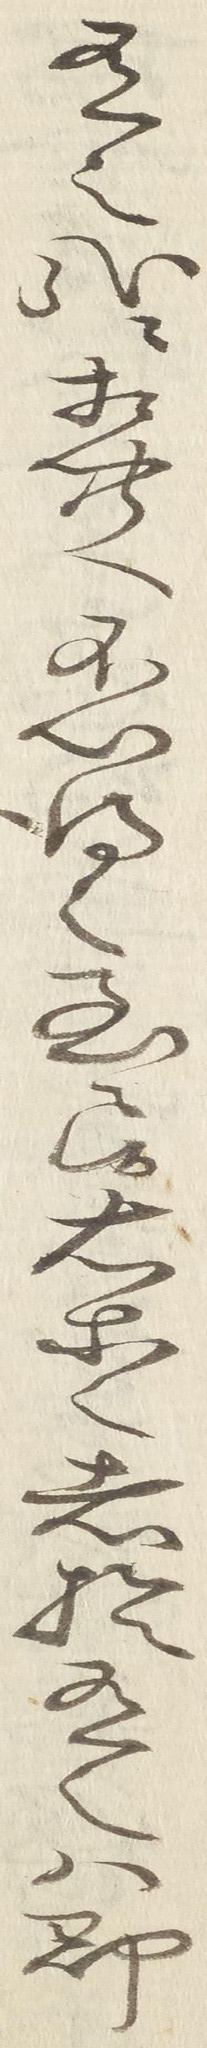有之哉二相聞へ不心得之至二候右等之者於有之は即
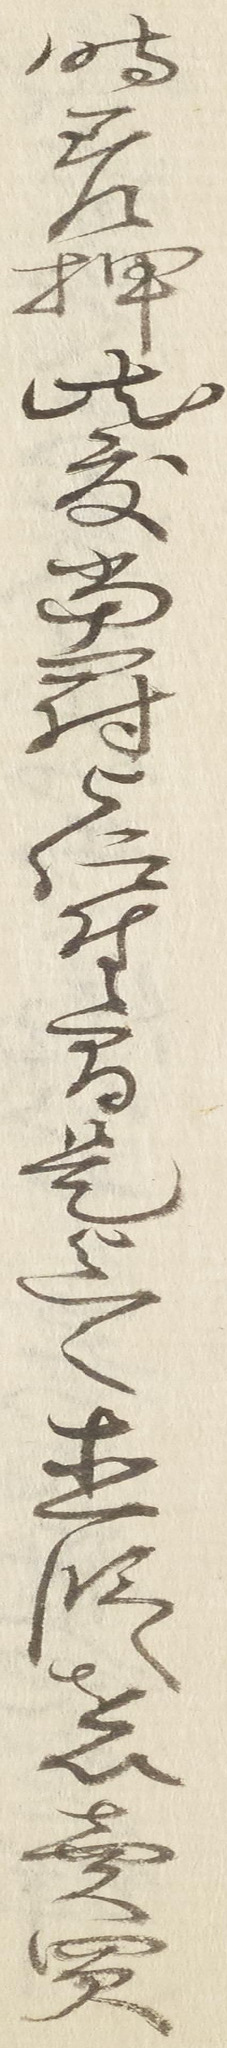時差押屹度當罰被仰付候間是迄之直段を以売買
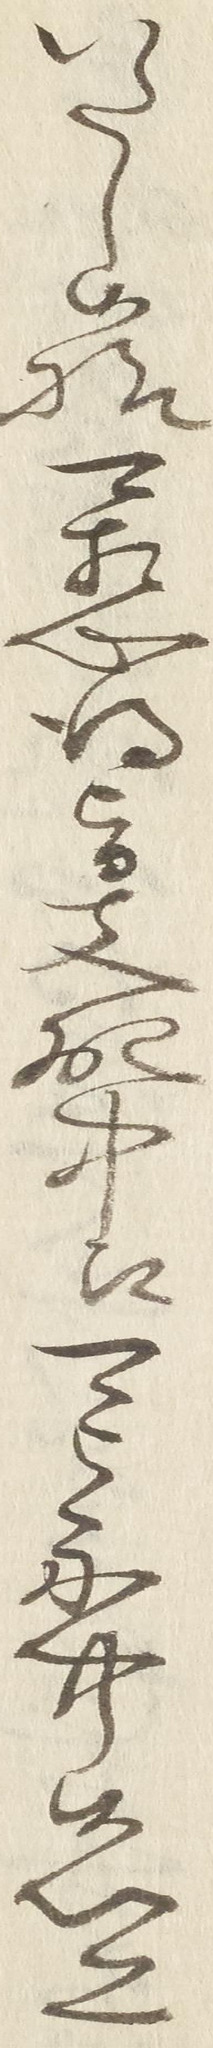いたし候様可相心得旨支配中江可被示中候以上
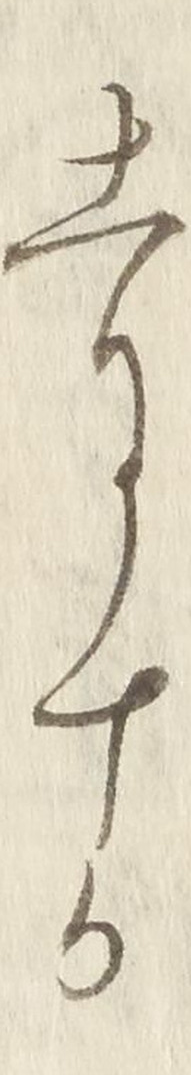十一月十日
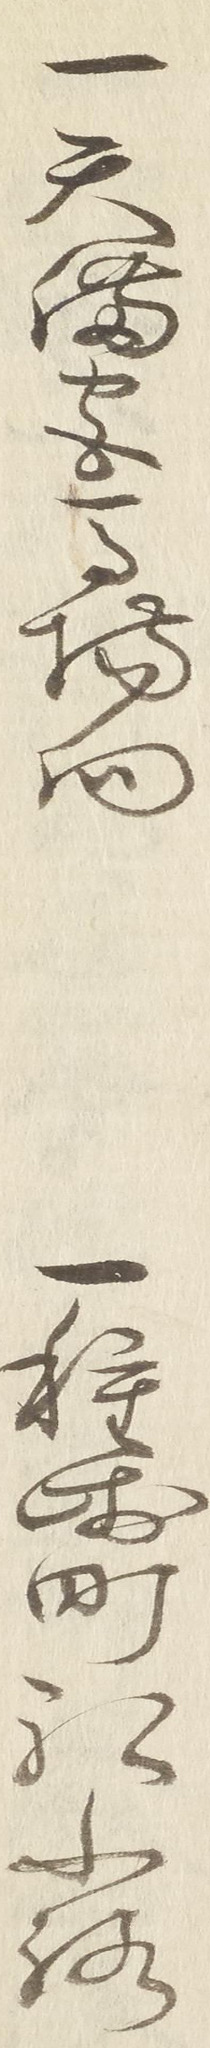一天満宮馬場向一種崎町弘小路
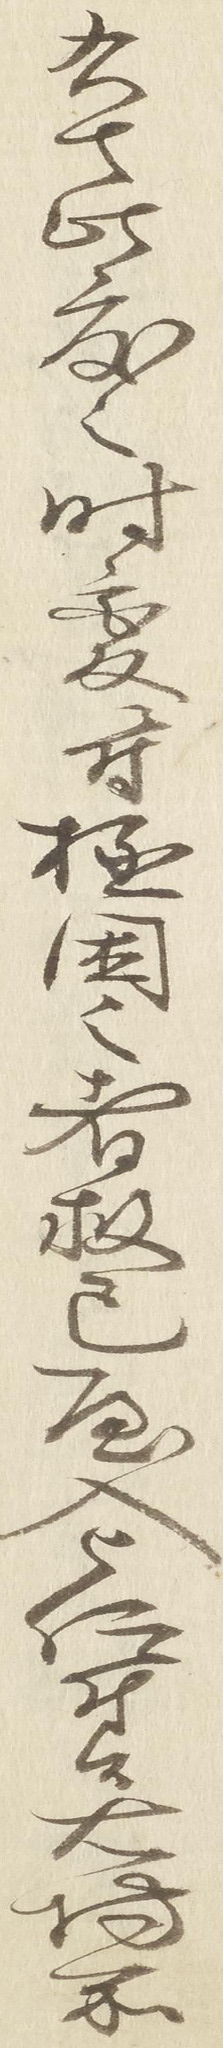右は此度之時変二付極困之者救已屋入被仰付候右場所
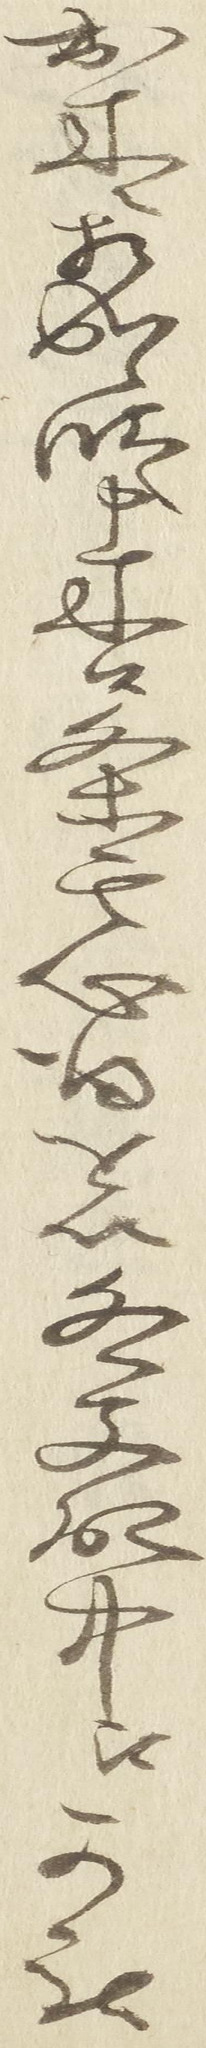出来二相成候段申来候条其心得を以各々支配中江可被

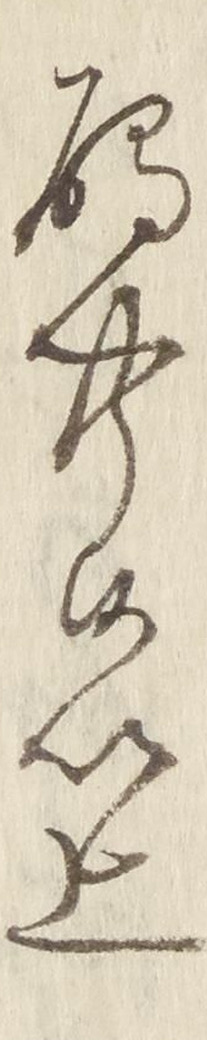触中候以上
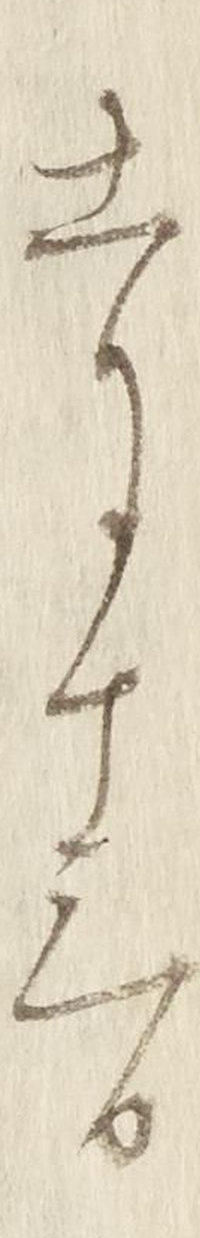十一月十三日
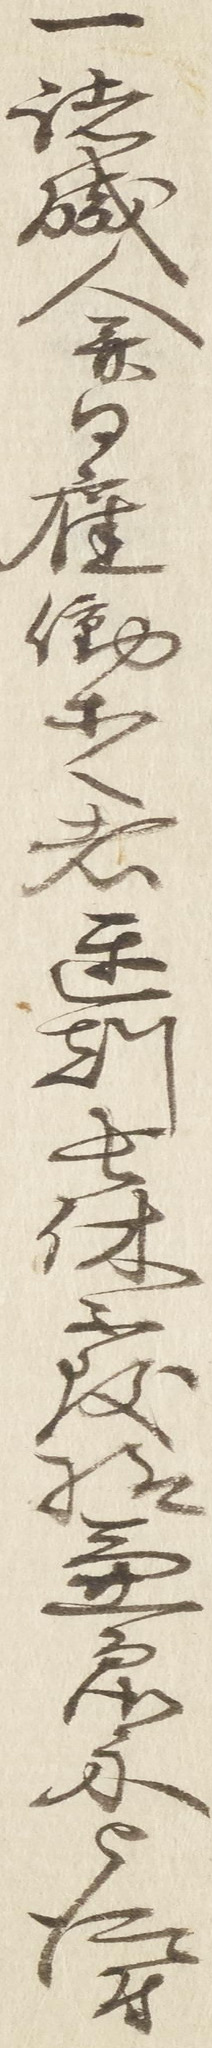一諸職人并日雇働等之者遅刻長休不致様兼而御示被仰付
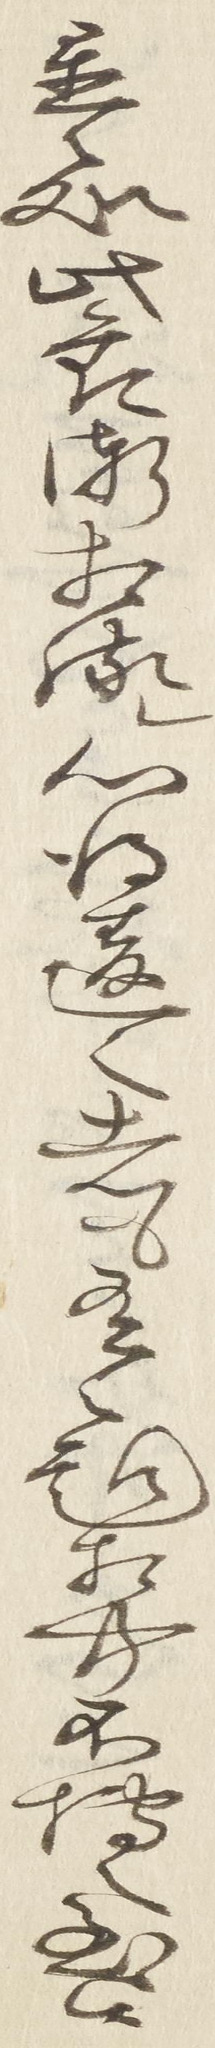置候処此節漸相流ㇾ心得違之者も有之趣相聞不埒之至候
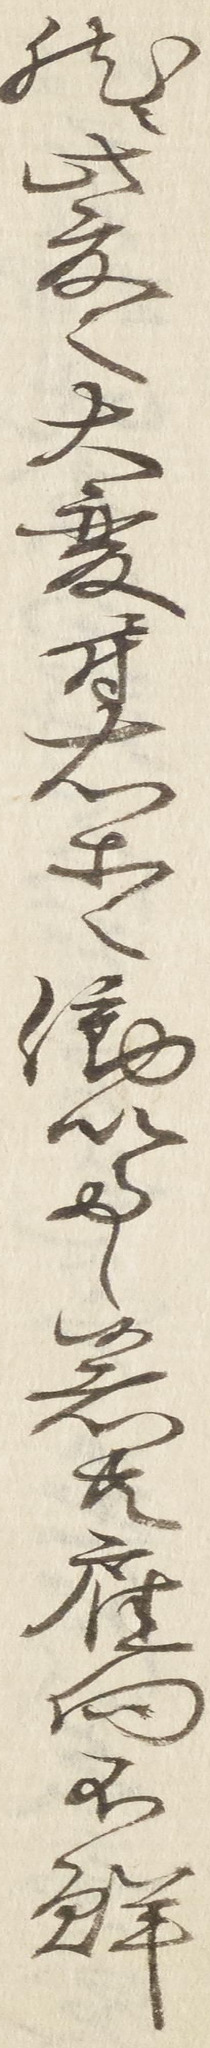然二此度之大変二付右等之働いたし候者共雇向不鮮
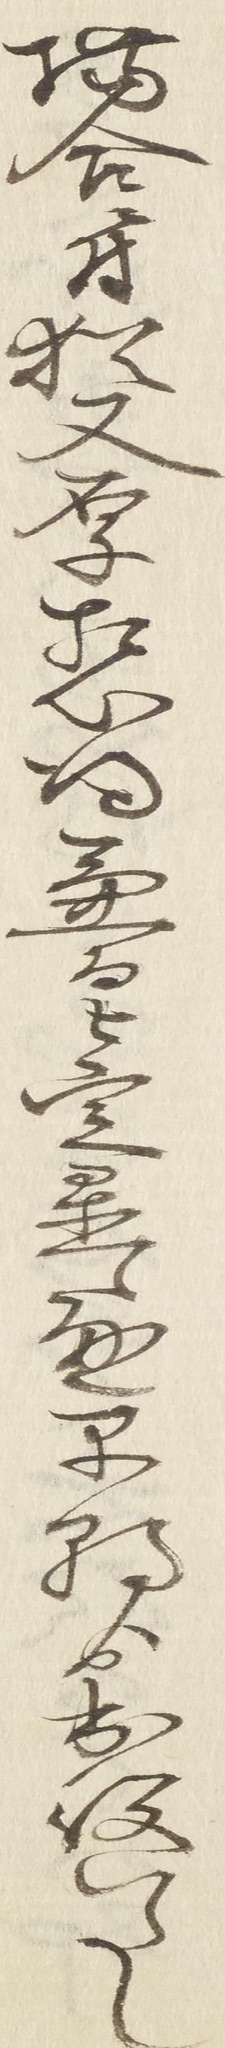場合二付猶又厚相心得兼而被定置候通早朝ゟ出役いたし
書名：地震記　下
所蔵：東京大学地震研究所図書室 Earthquake Research Institute Library, The University of Tokyo, JAPAN
